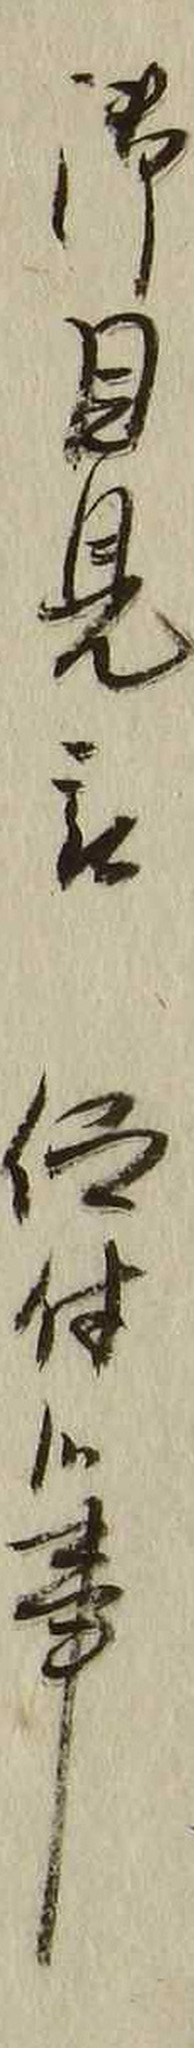御目見被仰付候事
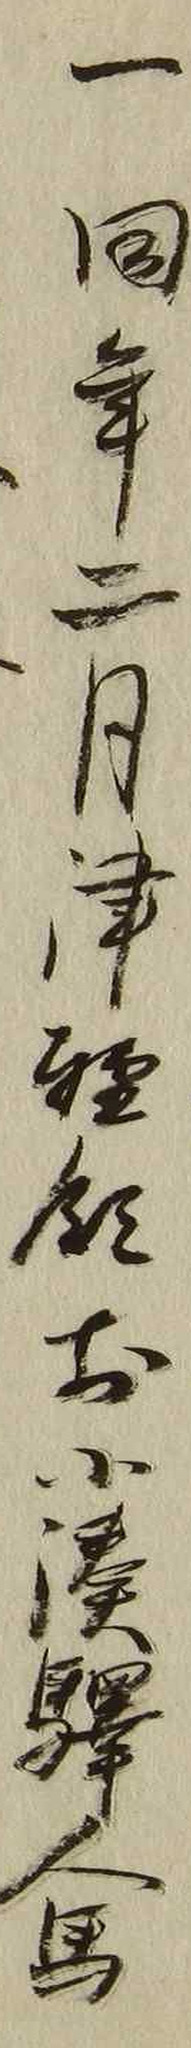一同年二月津軽領於小湊駅人馬
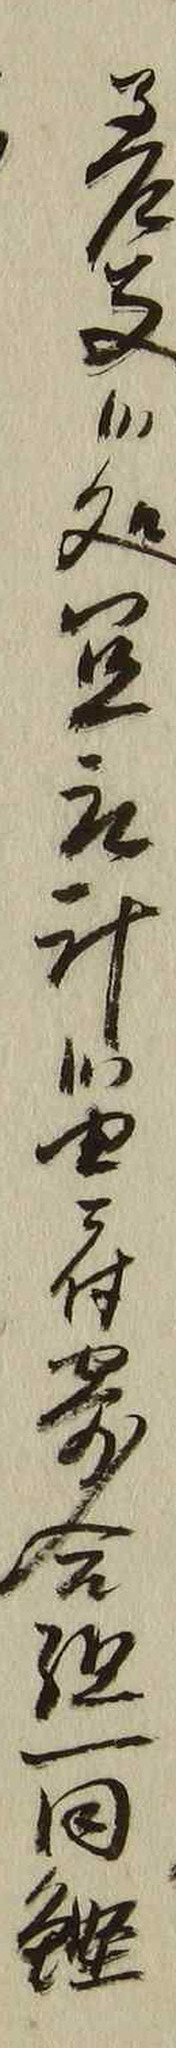差支候処宜取計候由ニ付寄合組一同鰹
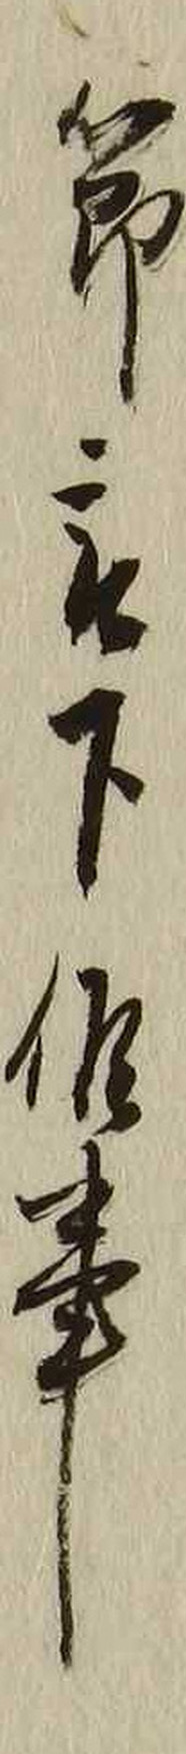節被下候事
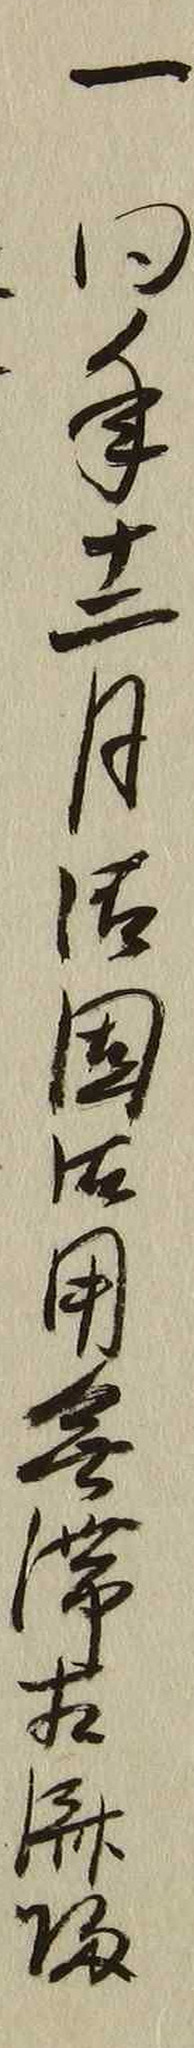一同年十二月御固御用無滞相済帰
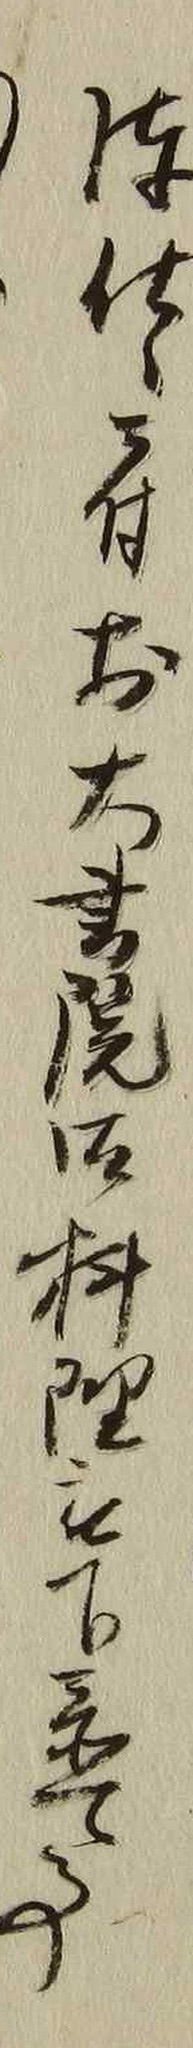陣仕候ニ付於大書院御料理被下置候事
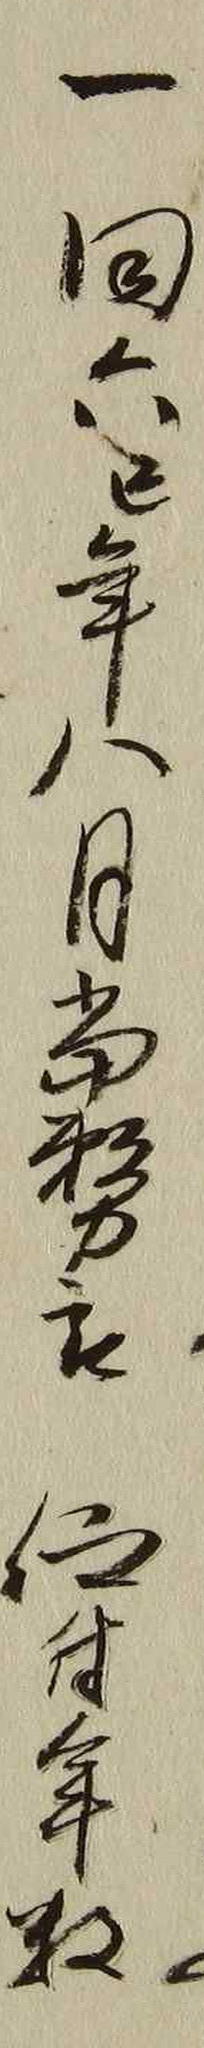一同六巳年八月当務被仰付年数
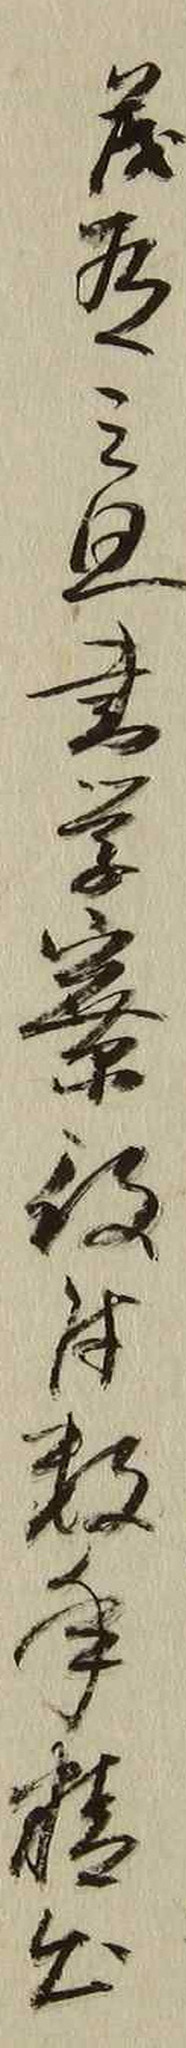茂有之且書学寮役付数年精出
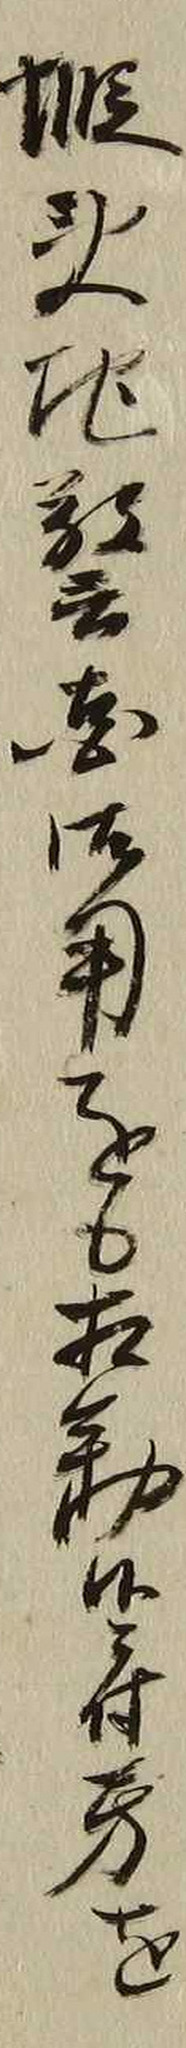蝦夷地警固御用をも相勤候ニ付旁を
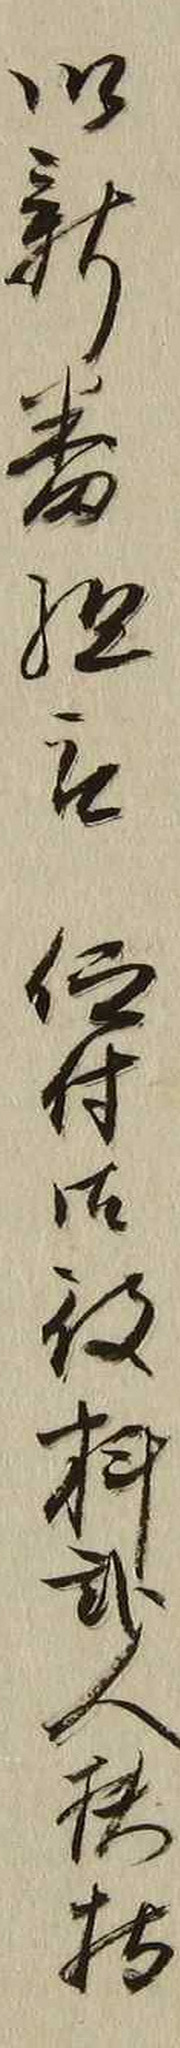御新番組被仰付御役料弐人扶持
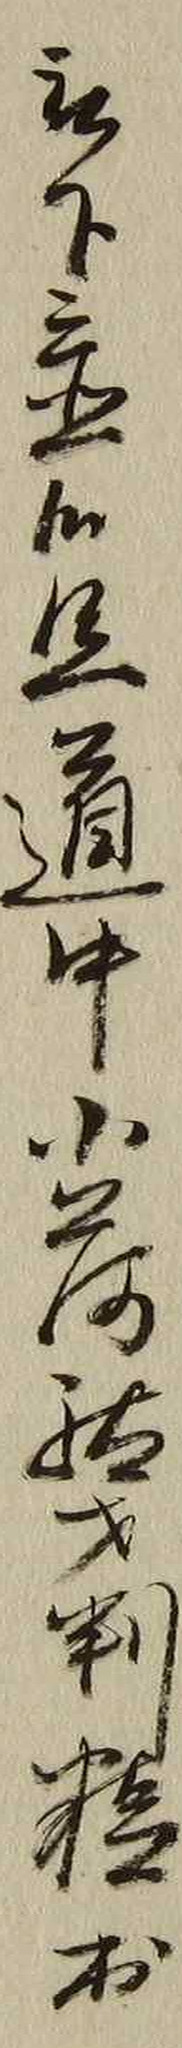被下置候且道中小荷駄才判精出
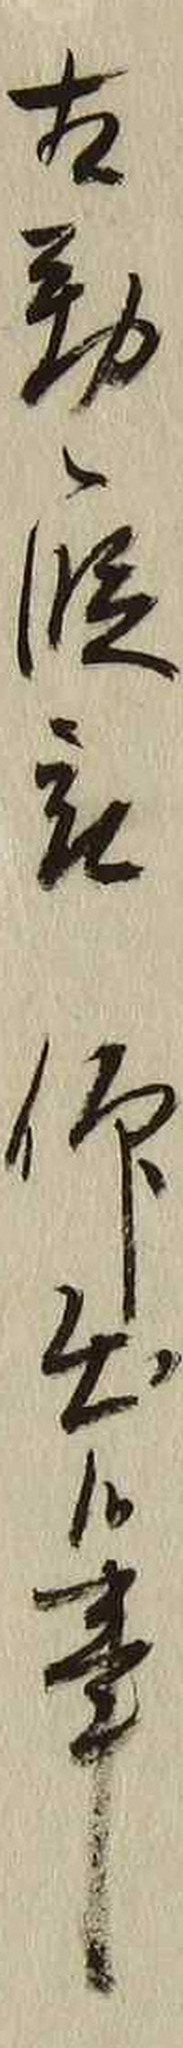相勤候段被仰出候事
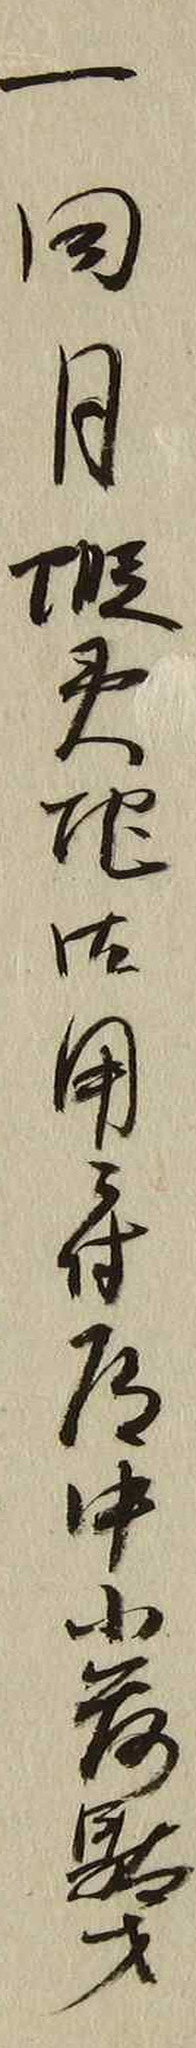一同月蝦夷地御用ニ付道中小荷駄才
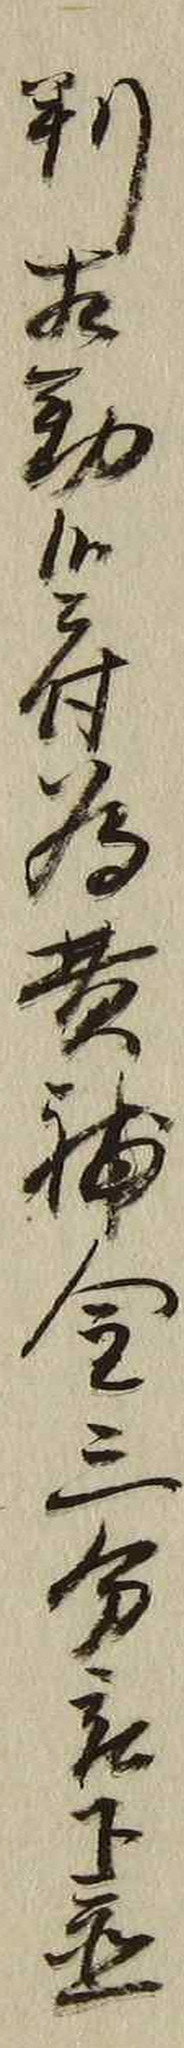判相勤候ニ付為費補金三分被下置
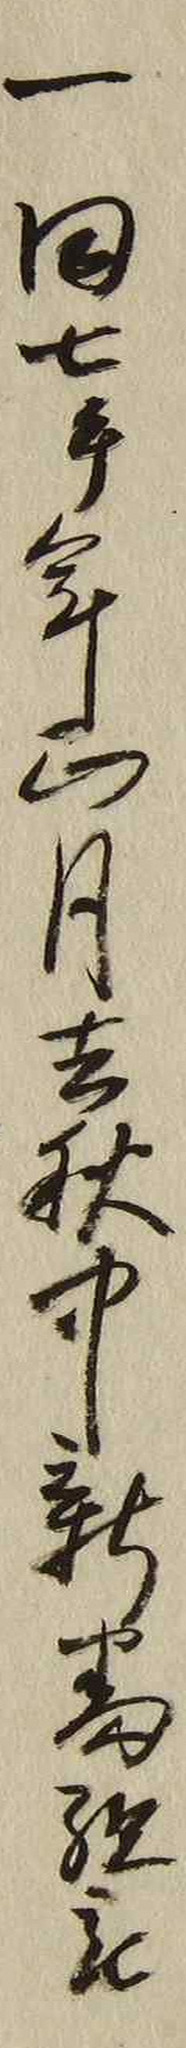一同七午年正月去秋中新番組被
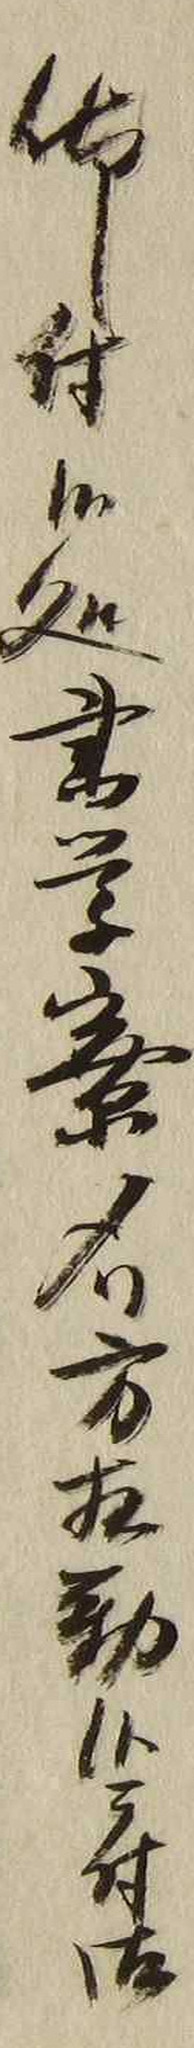仰付候処書学寮〆り方相勤候ニ付御
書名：諸士系譜　巻之349　も之部5
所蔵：会津若松市立会津図書館
